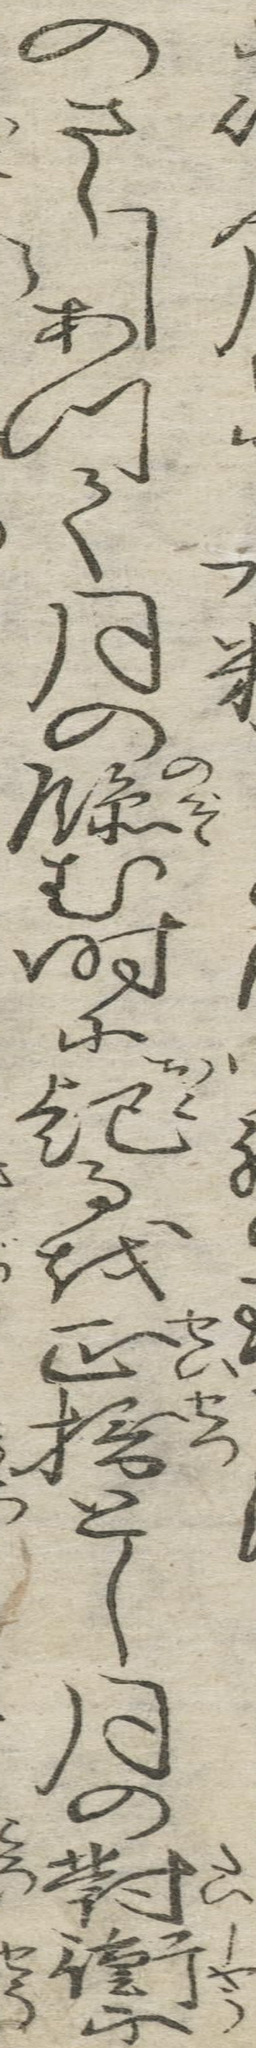のさし引あつて月の臨む時に起るを正接とし月の対衝に
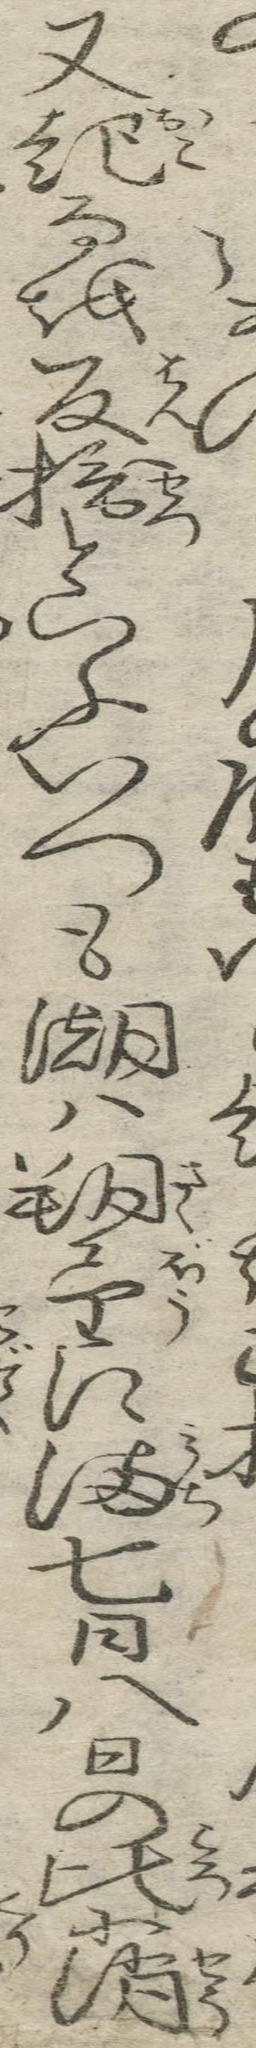又起るを反接といふいつも潮は朔望に満七月八日の比に消
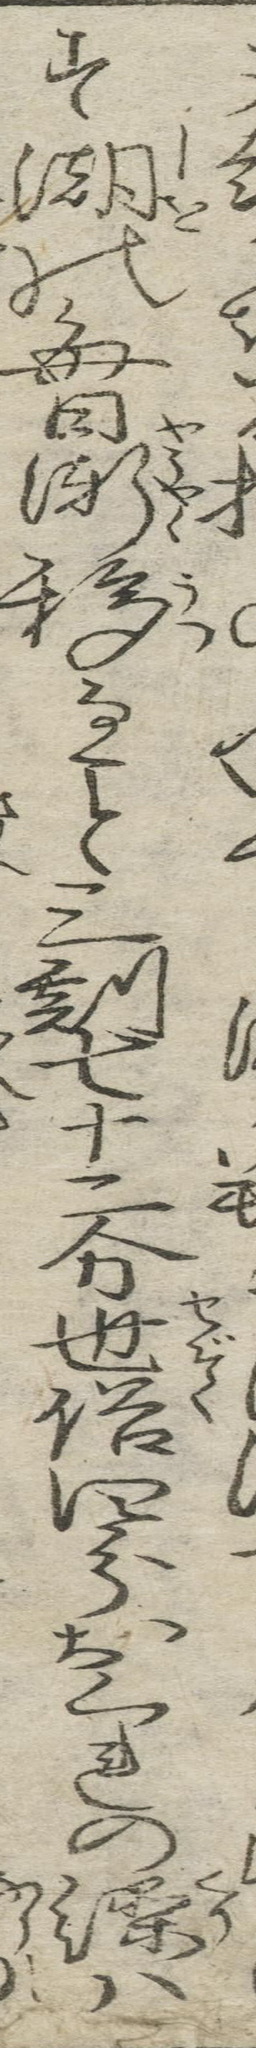す潮の毎日漸移ること三刻七十二分世俗四分おくれの繰は
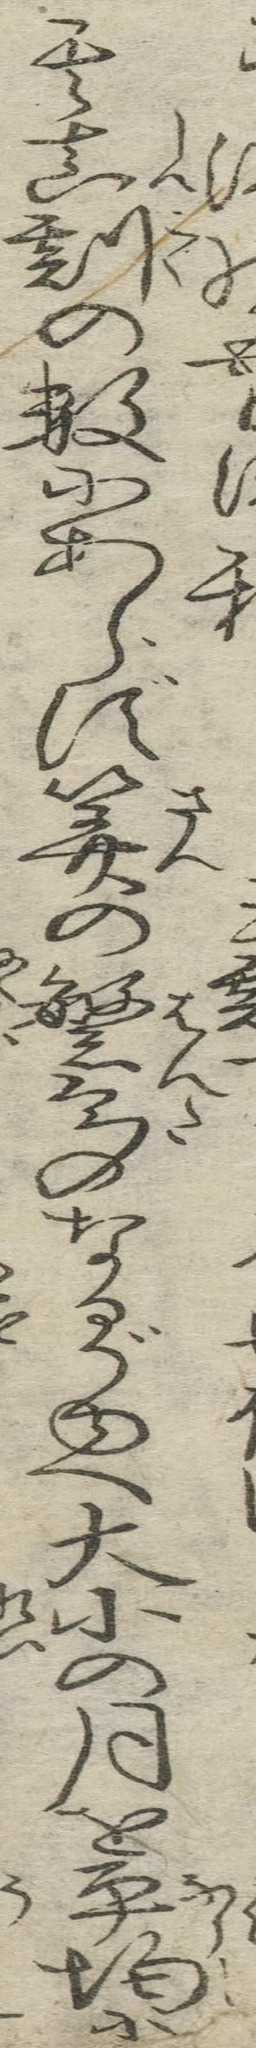其真刻の数にあらず算の繁多なるがゆへ大小の月を平均に
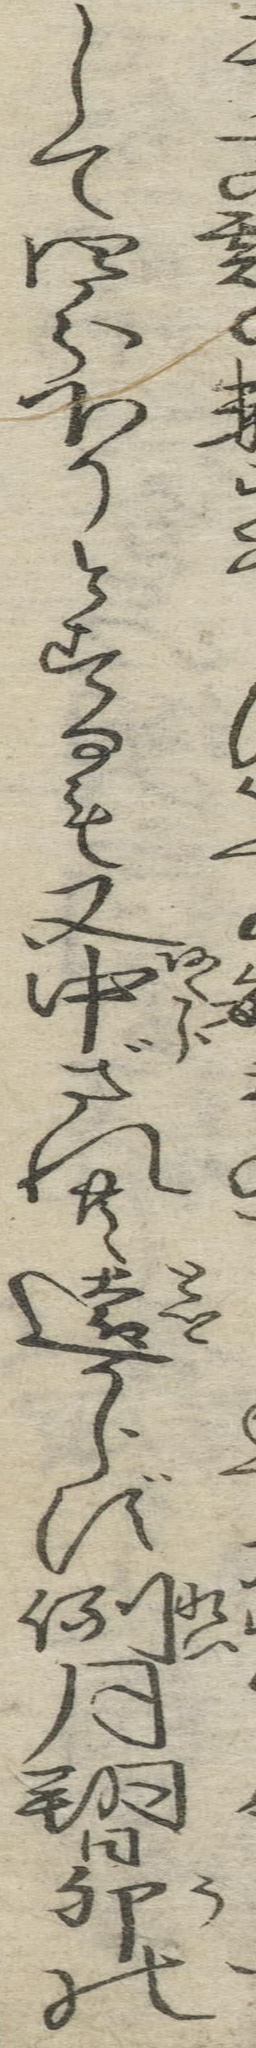して四分下りとするも又中ざれども遠からず例月朔月卯の

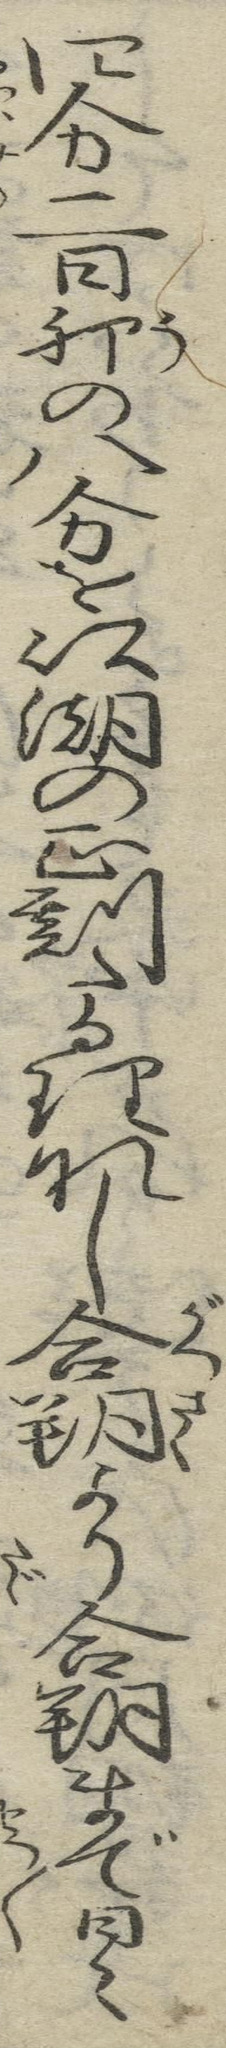四分二日卯の八分を以潮の正刻たる理なし合朔より合朔まで日〻
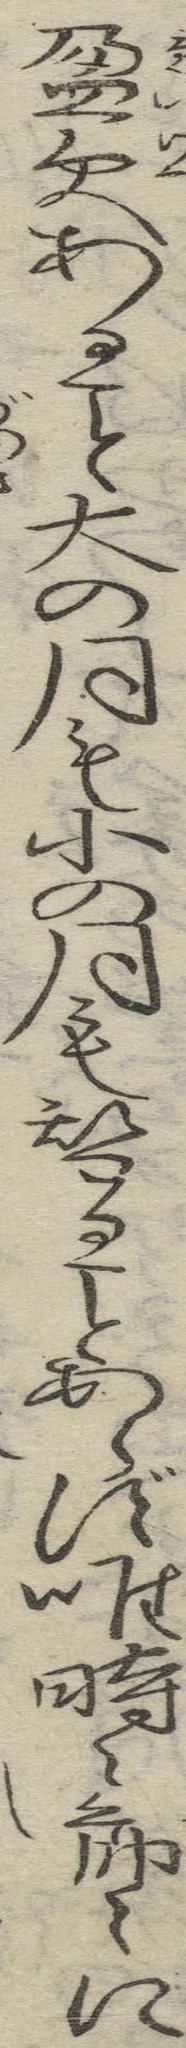盈欠あること大の月も小の月も知ることあらず唯時〻節〻に
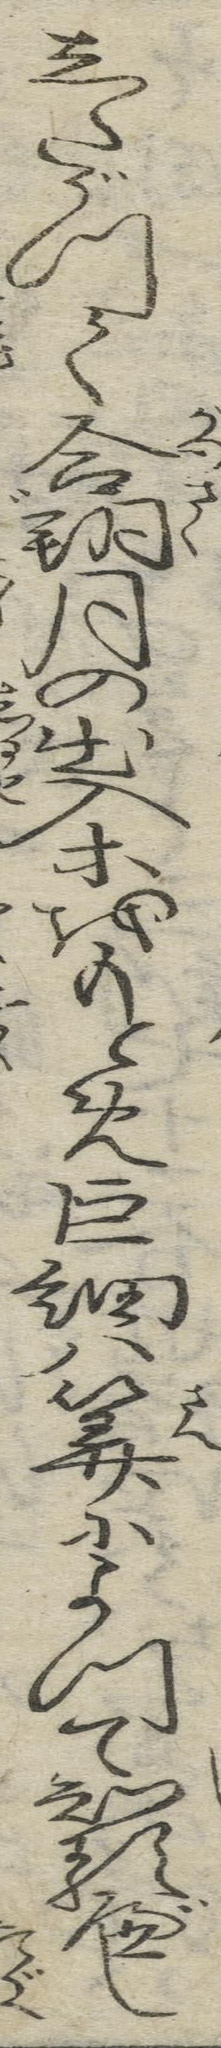したがつて合朔月の出入等をもとめ巨細は算によつて知るべし
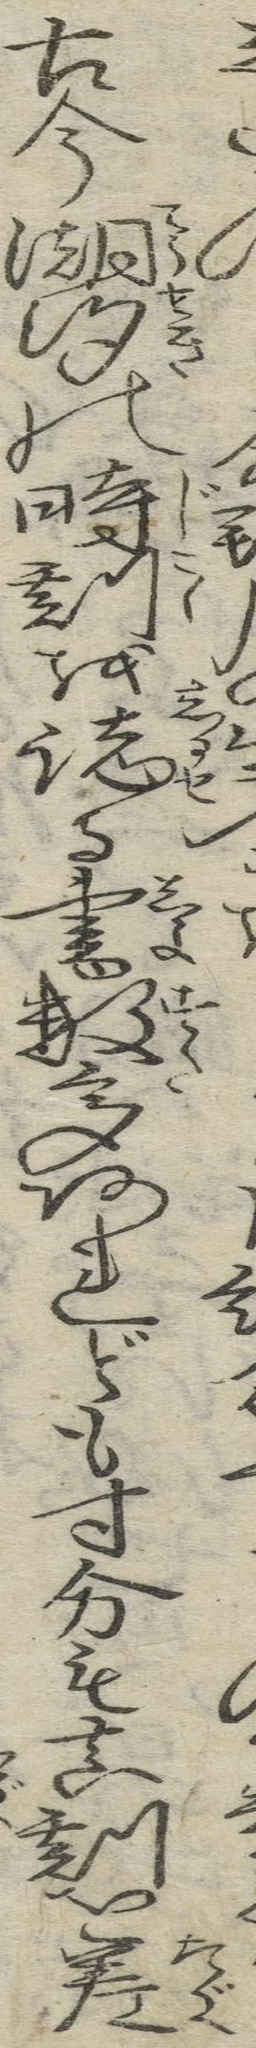古今潮汐の時刻を誌る書数多あれども寸分も真刻を差
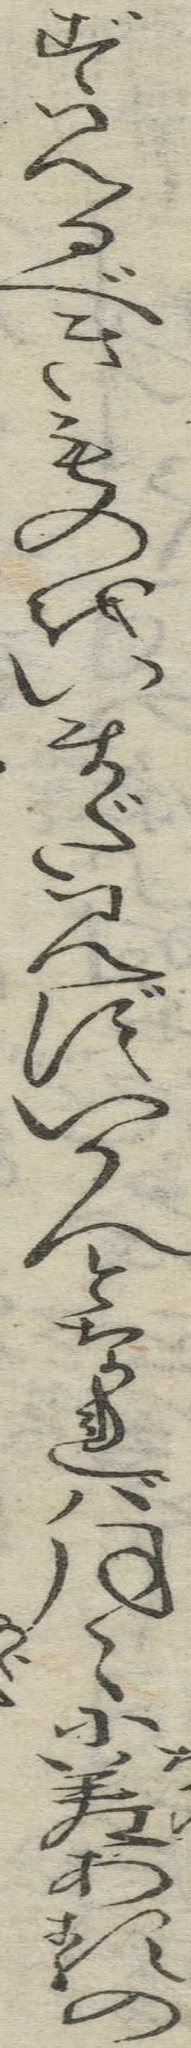ず見るべきものをいまだ見ずいかんとなれば月〻に差あるの
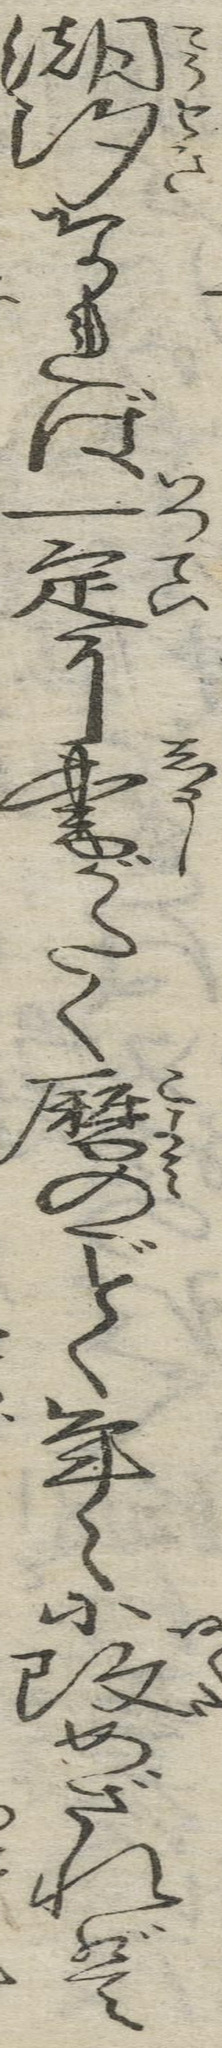潮汐なれば一定に書がたく暦のごとく年〻に改めざれば
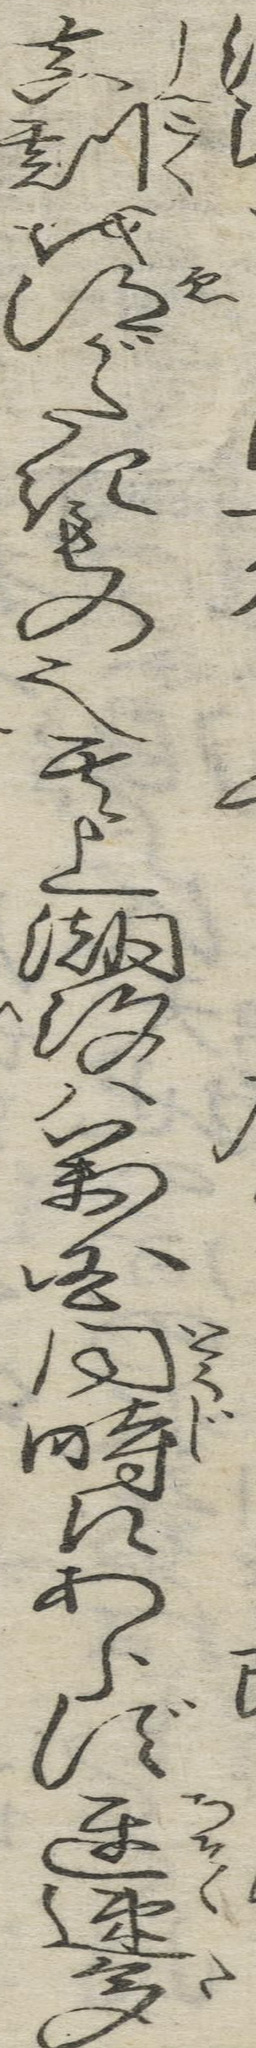真刻を得がたきもの也其上潮汐は萬国同時にあらず遅速多
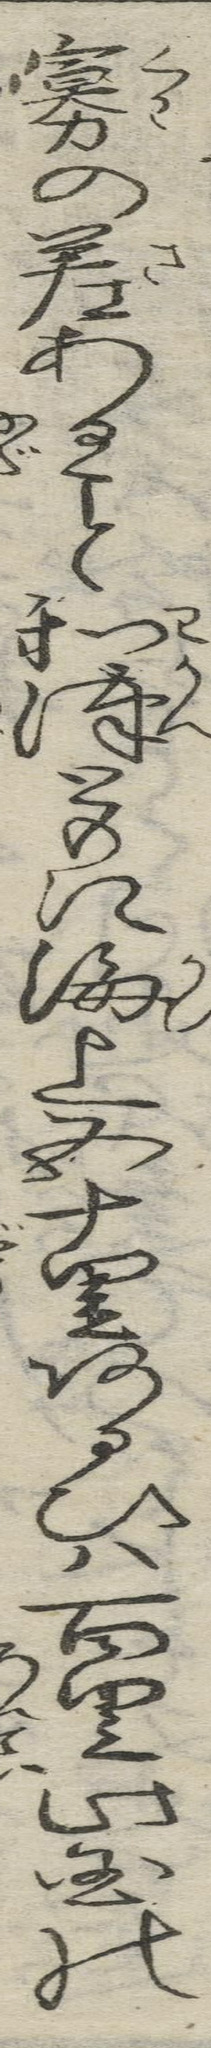寡の差あること和漢ともに海上五十里あるひは百里此国の
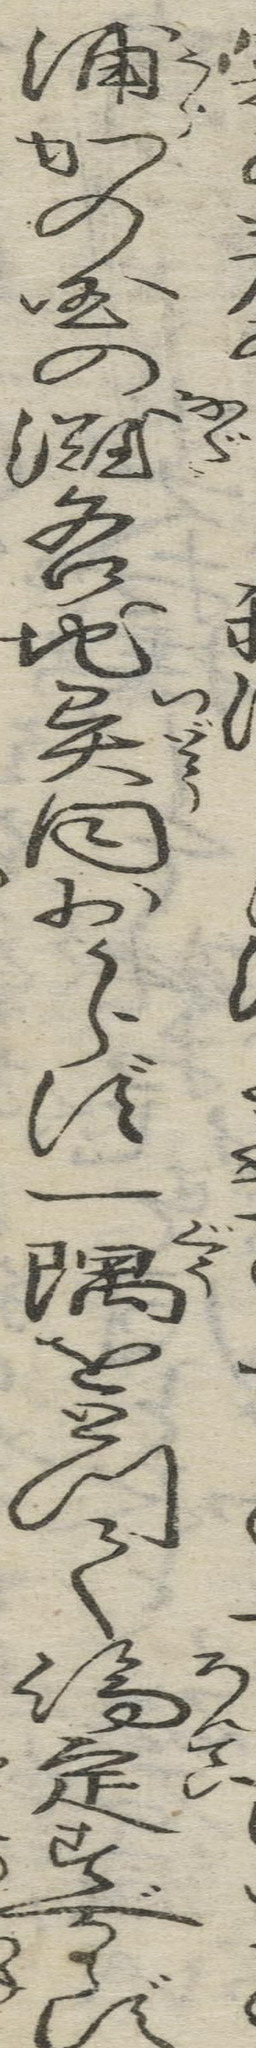浦かの国の灘有地異同少からず一隅をとつて論定すべからず
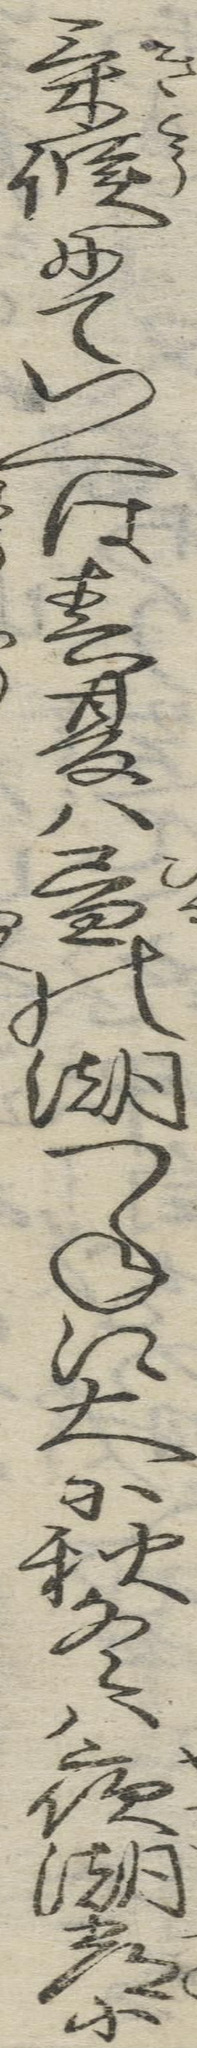気候にていへは春夏は昼の潮つねに大に秋冬は夜潮常に
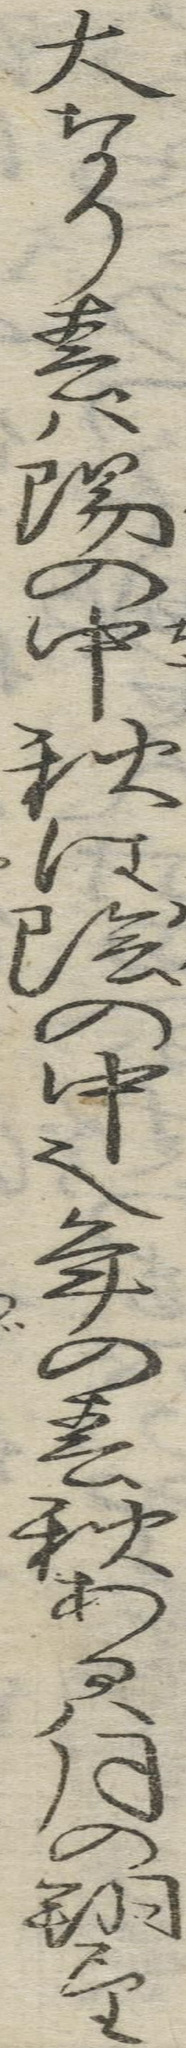大なり春は陽の中秋は陰の中也年の春秋あるは月の朔望
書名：訓蒙天地辨　地
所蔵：東京大学地震研究所図書室 Earthquake Research Institute Library, The University of Tokyo, JAPAN
